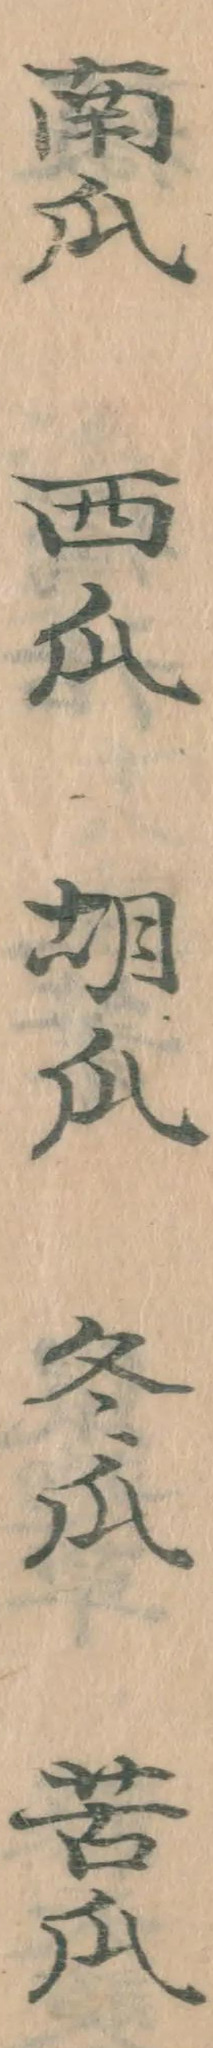南瓜西瓜胡瓜冬瓜苦瓜
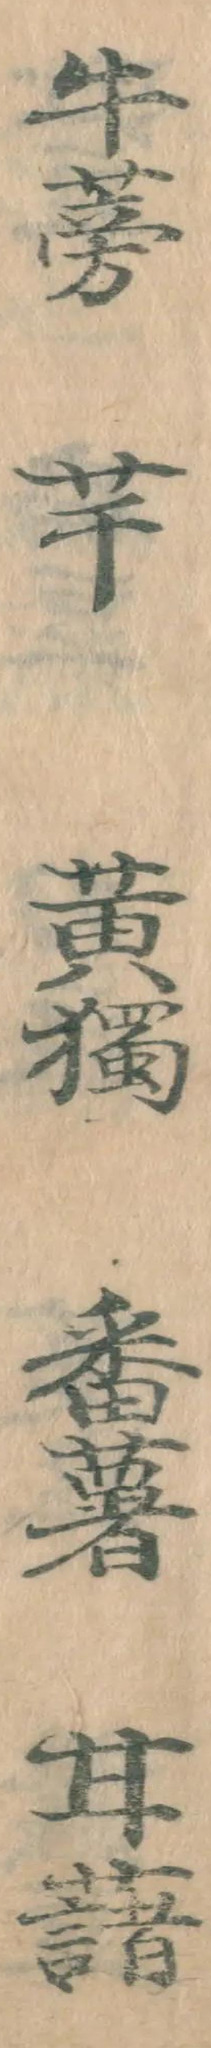牛蒡芋黄独番薯甘藷
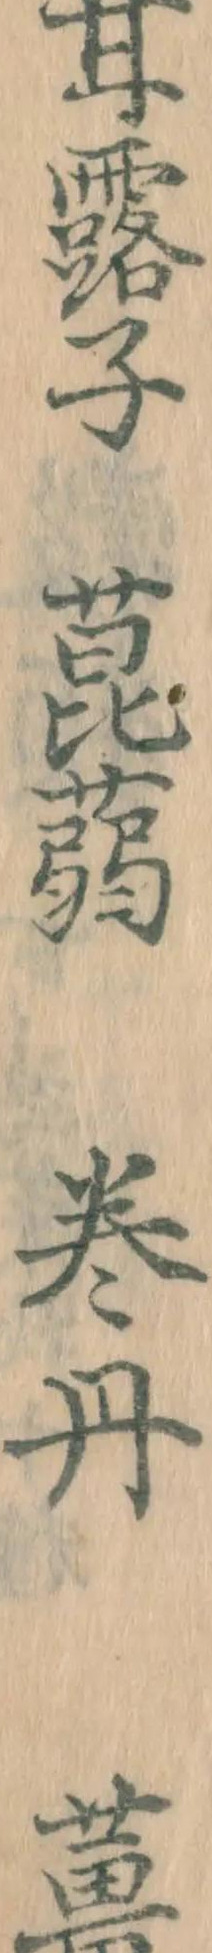甘露子菎蒻巻丹薑

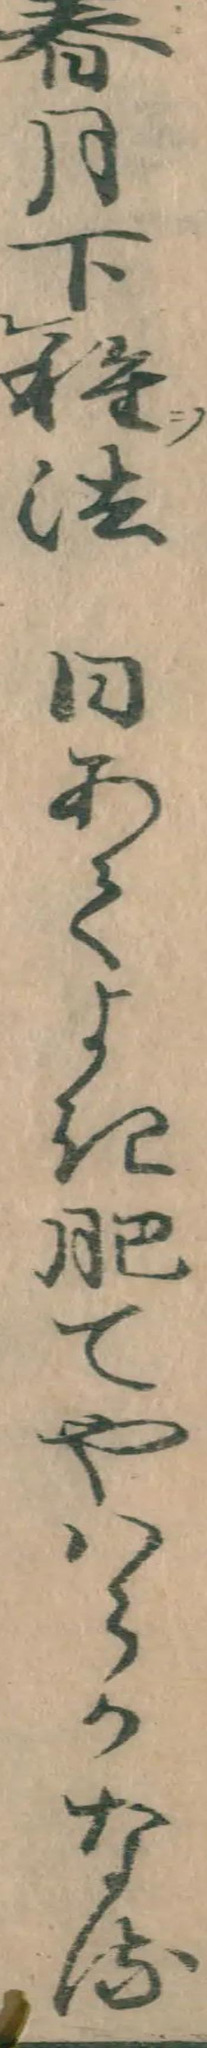春月下種法日あてよき肥てやはらかなる
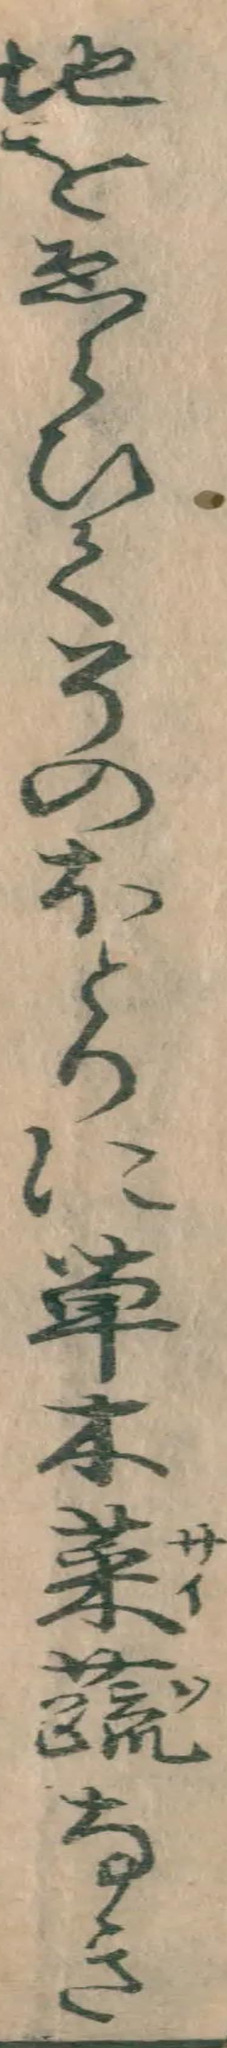地をゑらひてそのほとりに草木菜蔬なき
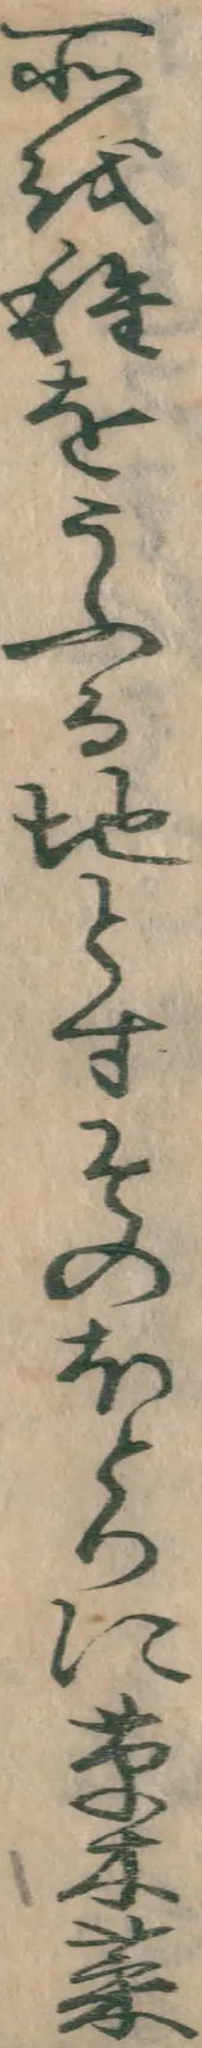所を種をうふる地とすそのほとりに草木菜
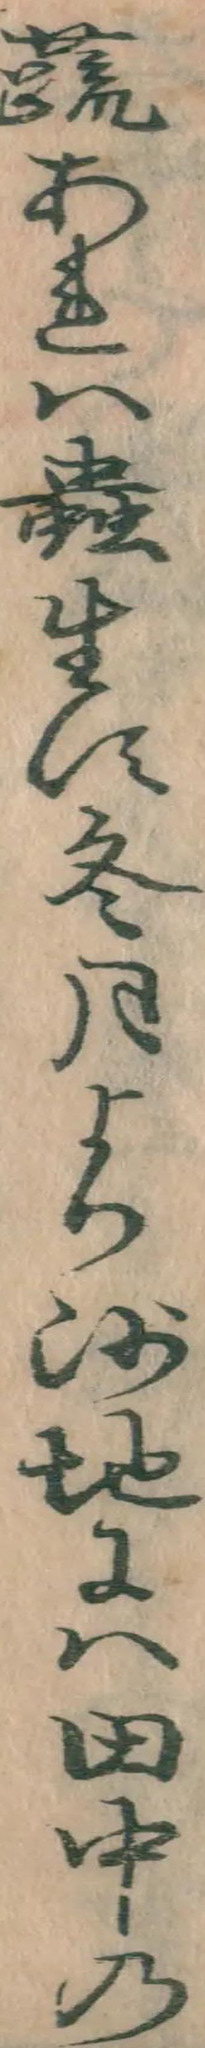蔬あれは蟲生す冬月より沙地には田中-の
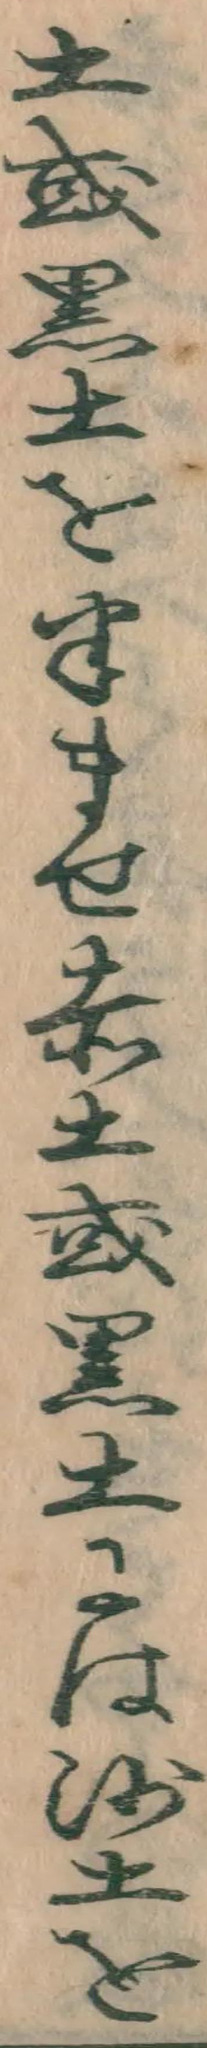土或黒土を半ませ赤土或黒土には沙土を
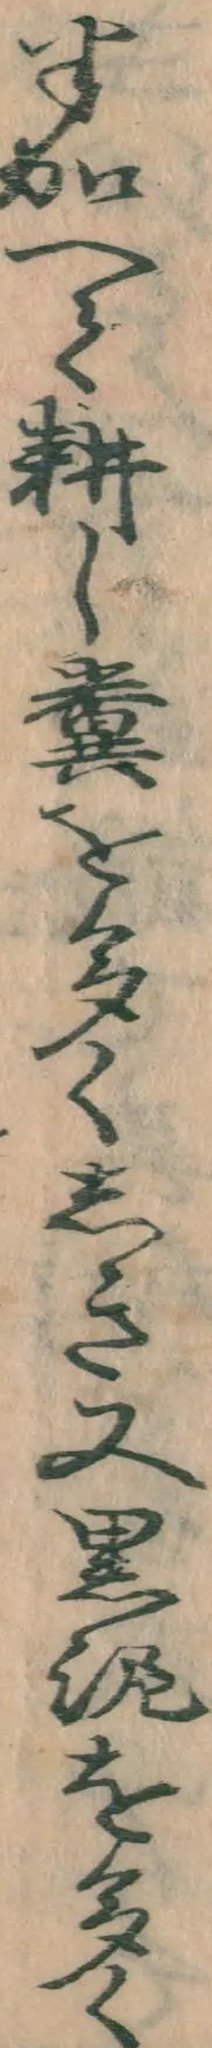半加へて耕し糞を多くしき又黒泥を多く
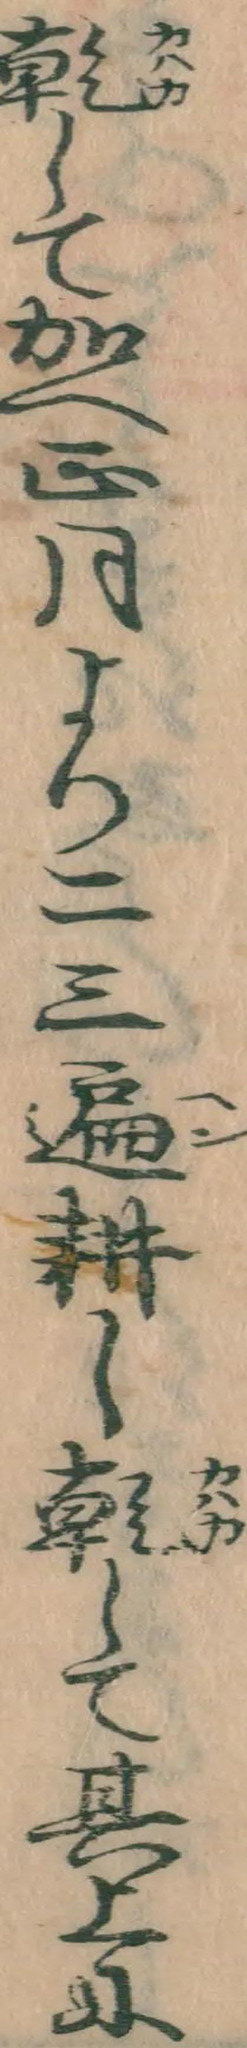乾して加へ正月より二三遍耕し乾して其上に
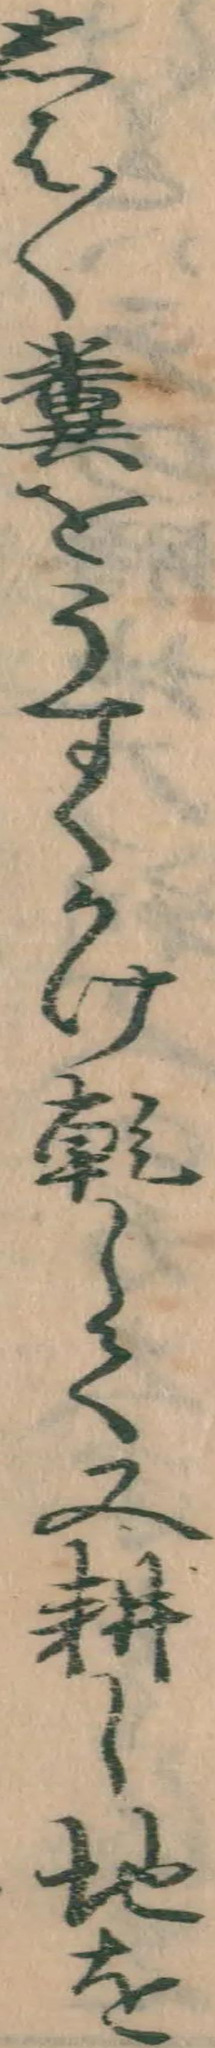しは〳〵糞をうすくかけ乾して又耕し地を
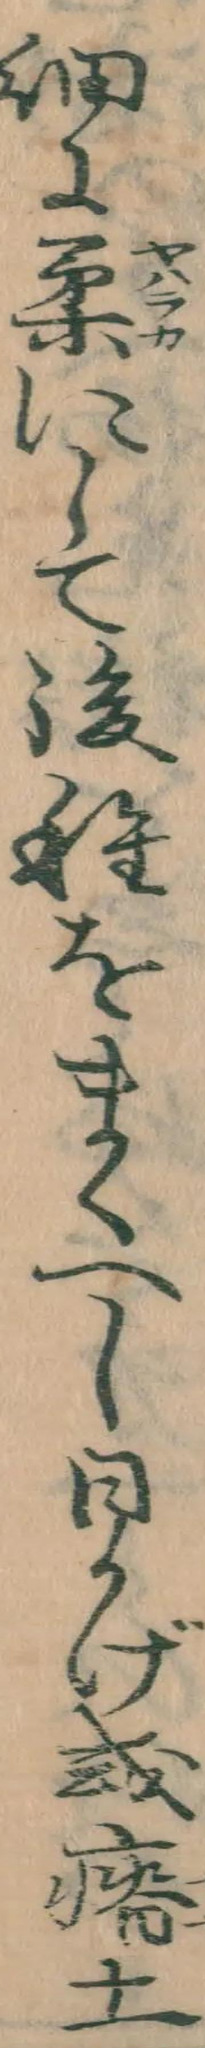細に柔にして後種をまくへし日かげ或瘠土
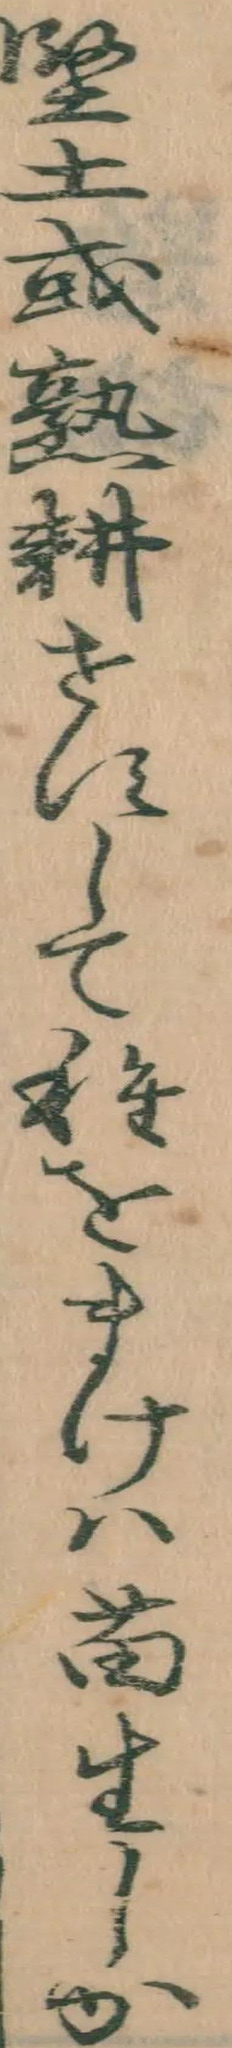堅土或熟耕せすして種をまけは苗生しか
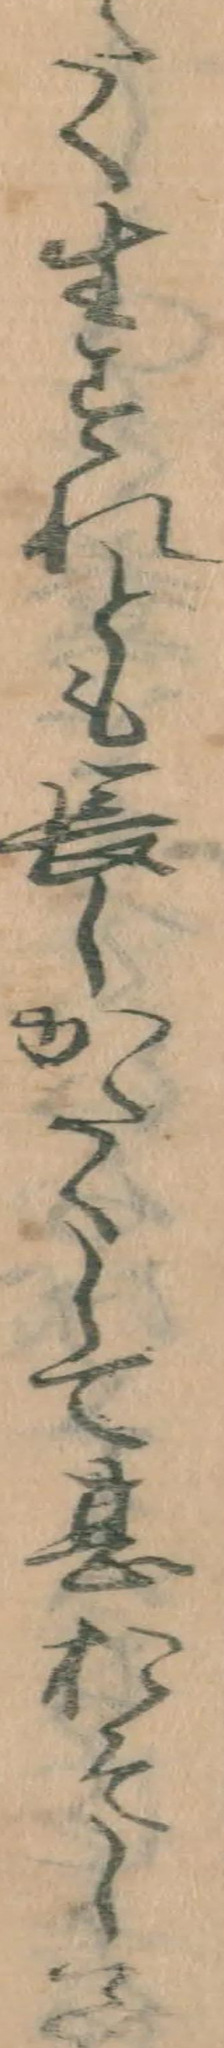たく生すれとも長しかたくして甚おそしそ
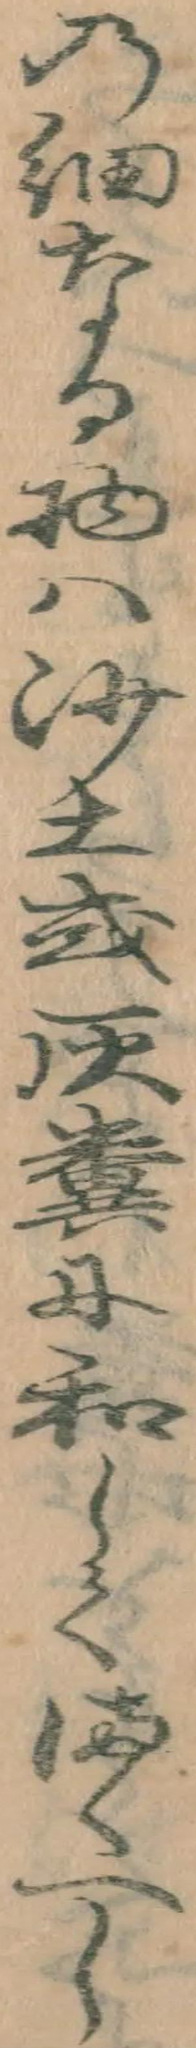の細なる物は沙土或灰糞に和してまくへし
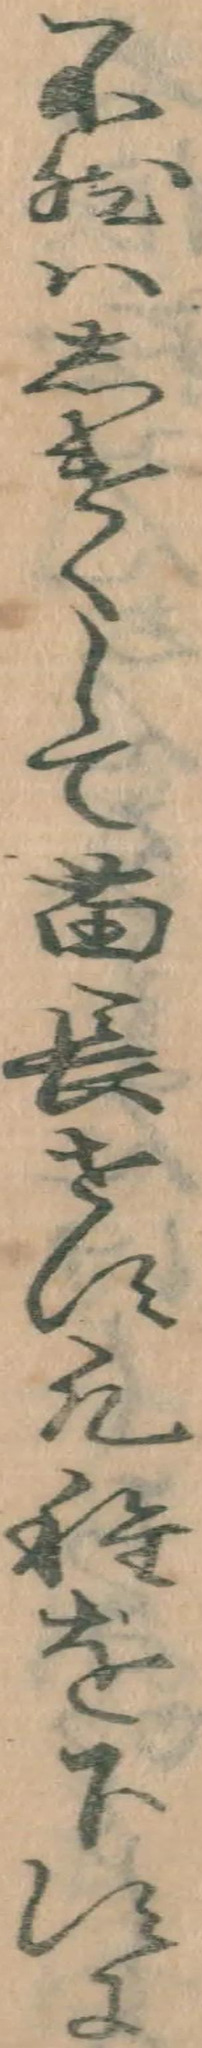不然はしけくして苗長せす凡種を下すに
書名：菜譜 3巻
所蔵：国立国会図書館 National Diet Library, JAPAN
